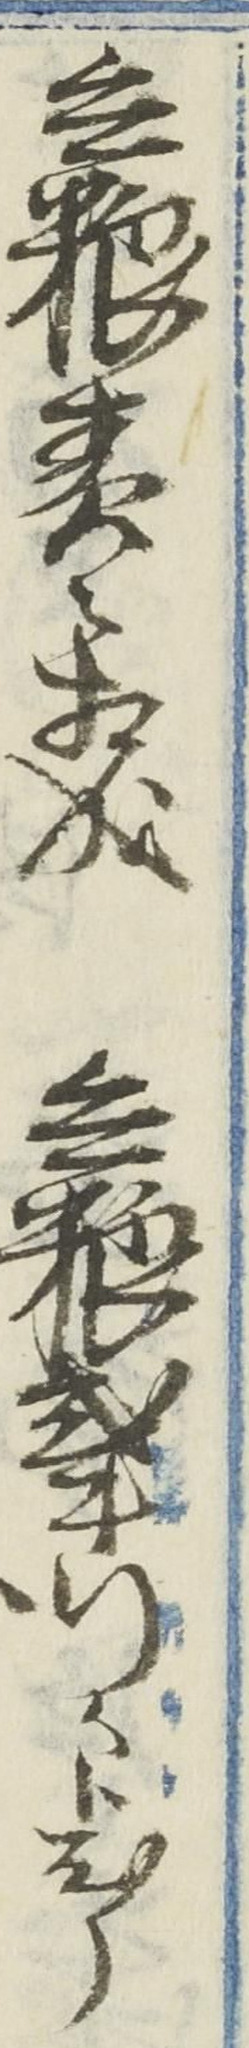兵粮責二相成兵粮奉行二ト云ウ
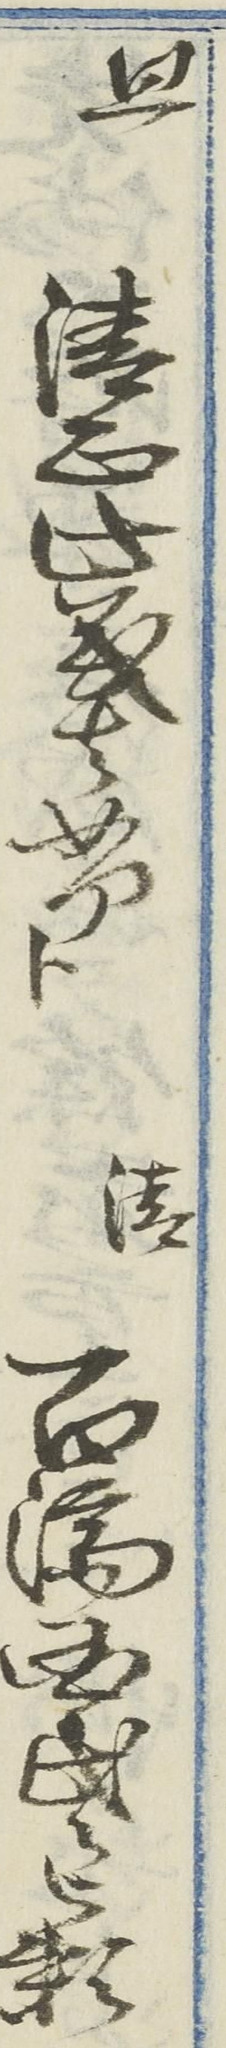且清正此義は如何ト清百済国氏二被頼
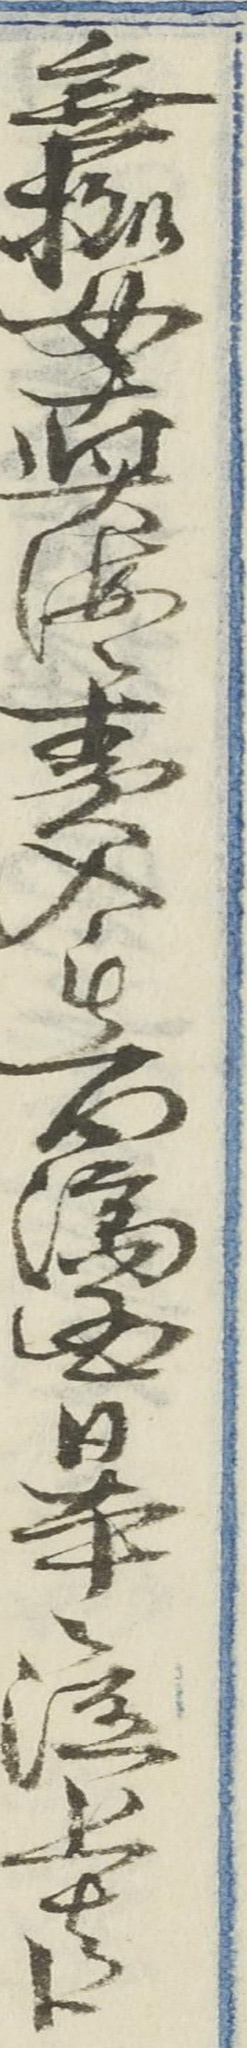無拠女真海二責入も百済国日本二泣？上はト
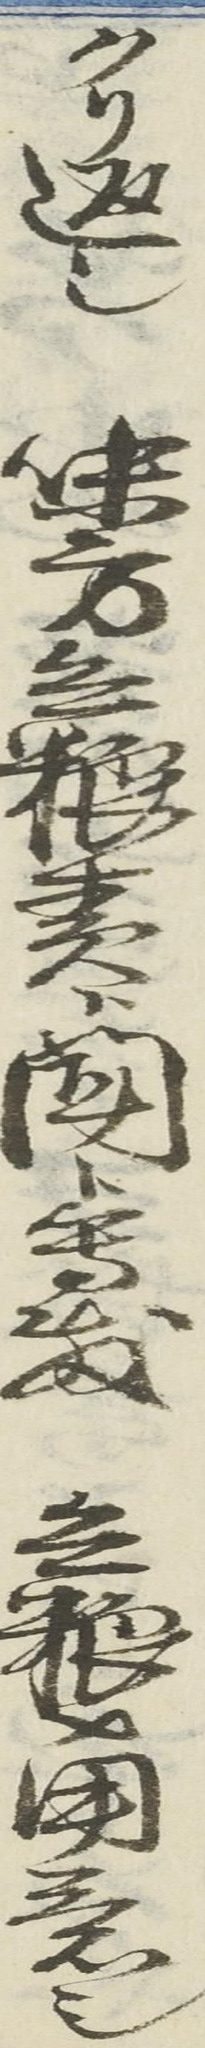クリ返し味方兵粮責ト聞ト等敷兵粮ヲ用意シ
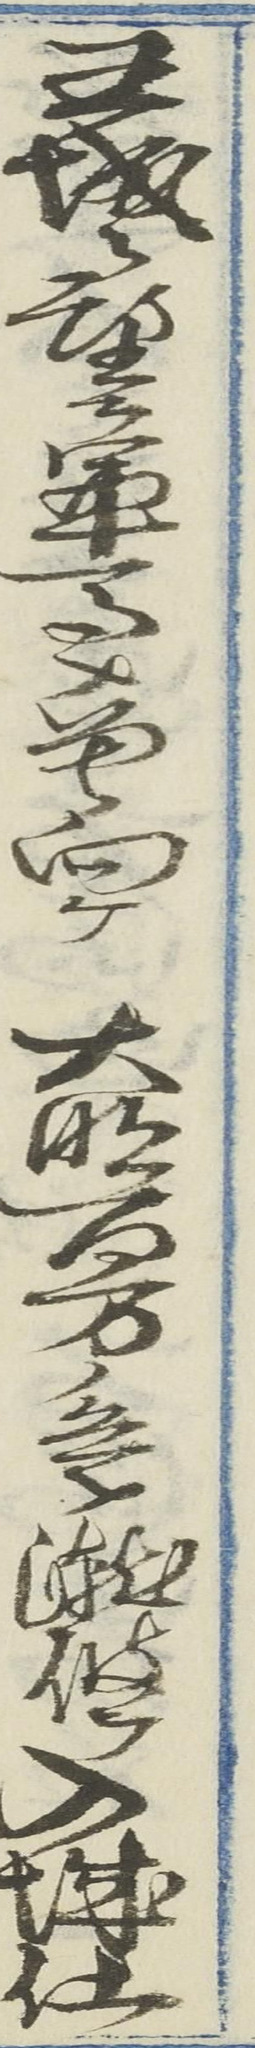王城二望テ軍馬ヲ差向ヶ大明百万ノ兵ヲ蹴破テ入城仕
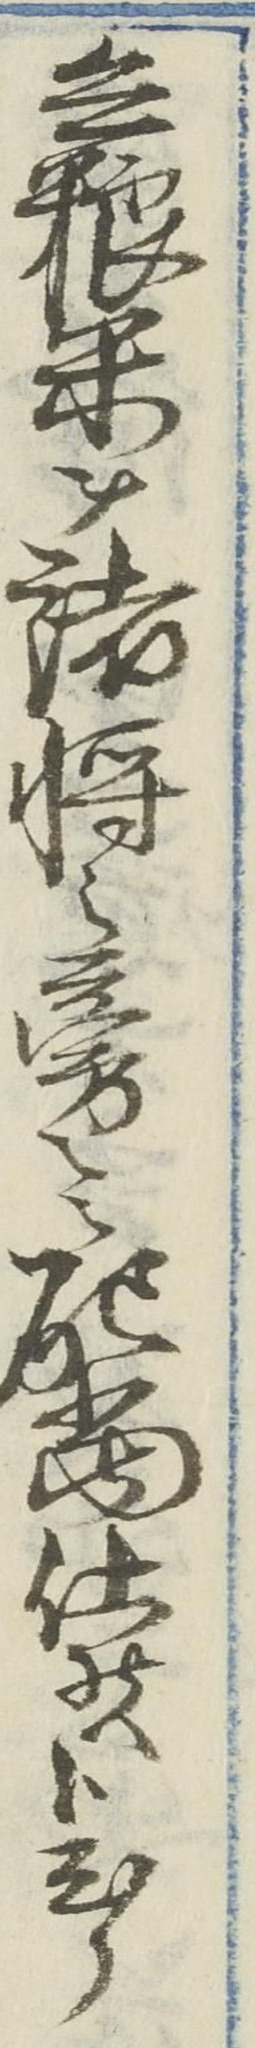兵粮米ヲ諸将之旁々二配当仕候ト云う
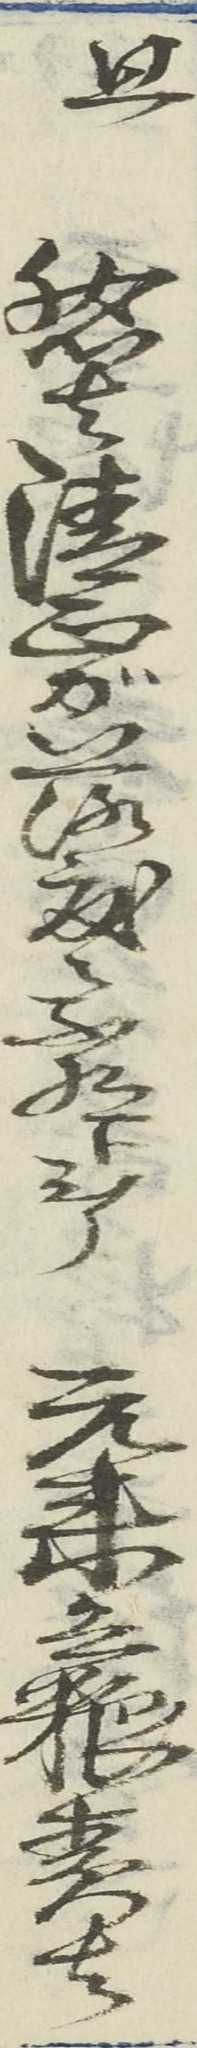且然は清正が落度二不有ト云う元来兵粮責は
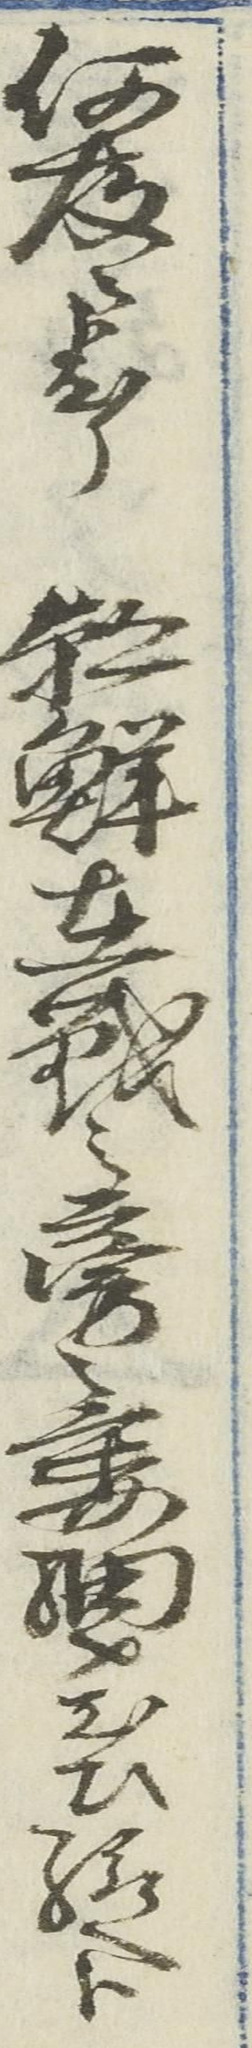何故二ト云う朝鮮在戦之旁二委細ヲ云ひ給ヘト
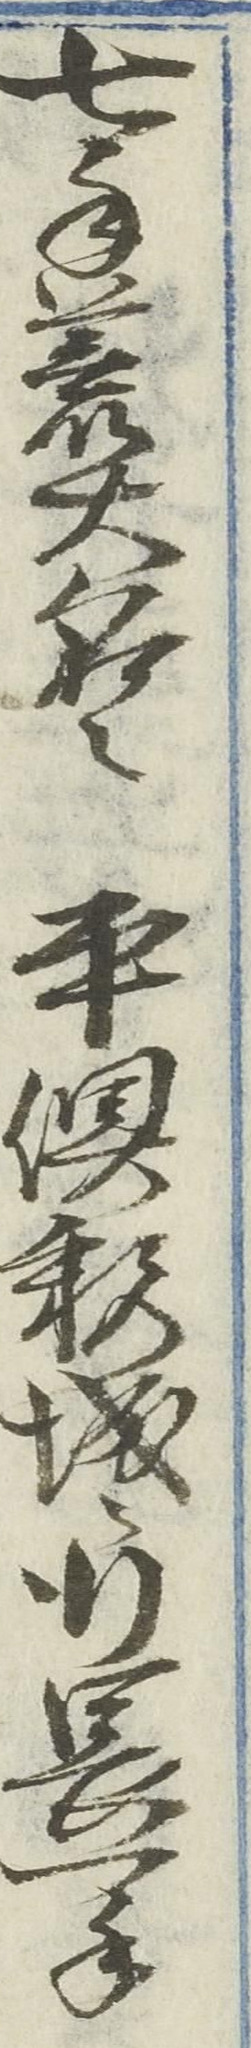七手荒大名之平俱駅城行長一手
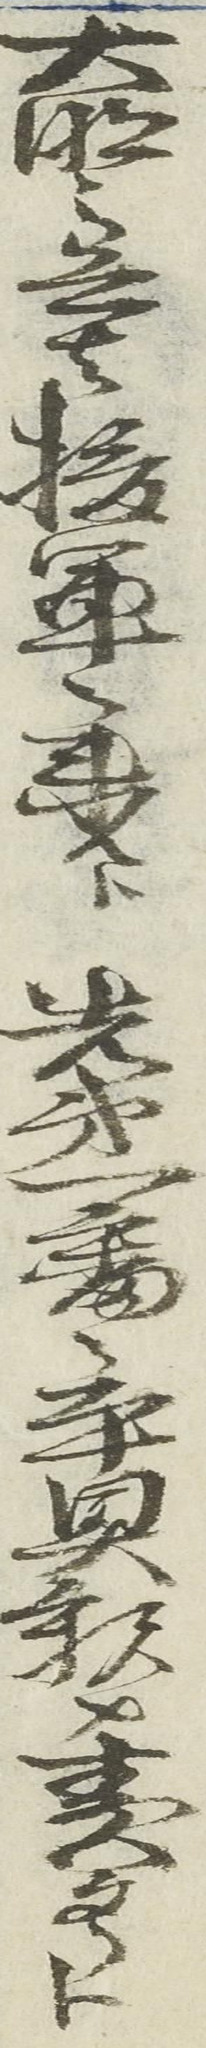大明之兵は援軍ニ来ㇽト先第一番二平具駅ヲ責タりト
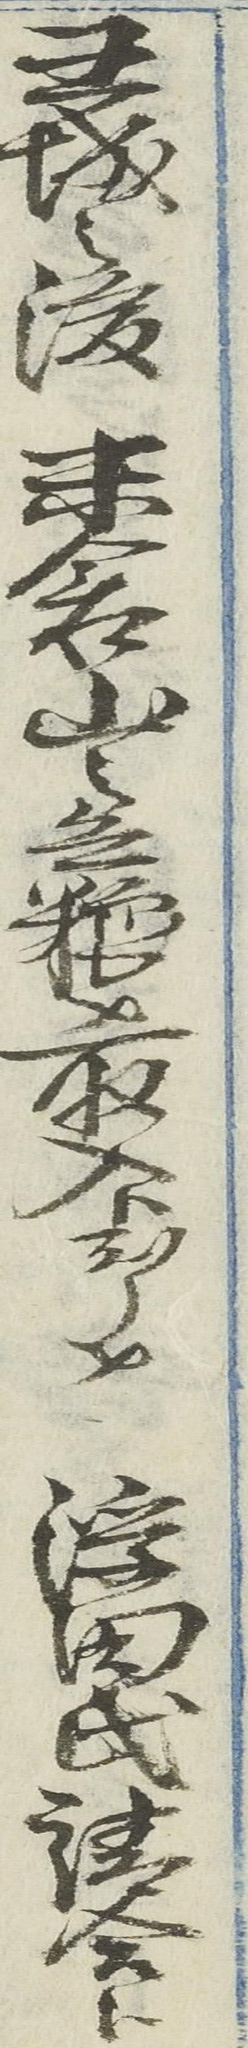王城之後米倉山之兵粮ヲ取入ト云うヲ浮田氏請合ト
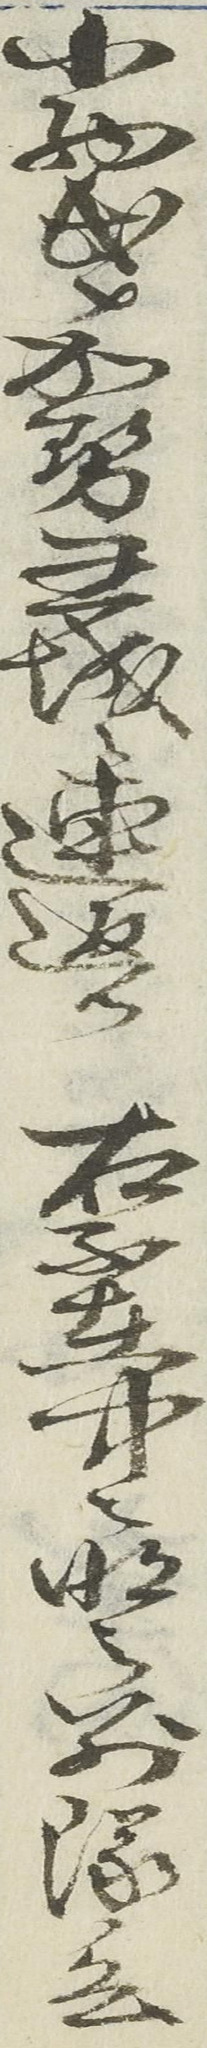小西氏ヲ加勢王城二連返ㇽ右不在中二明之別隊之兵
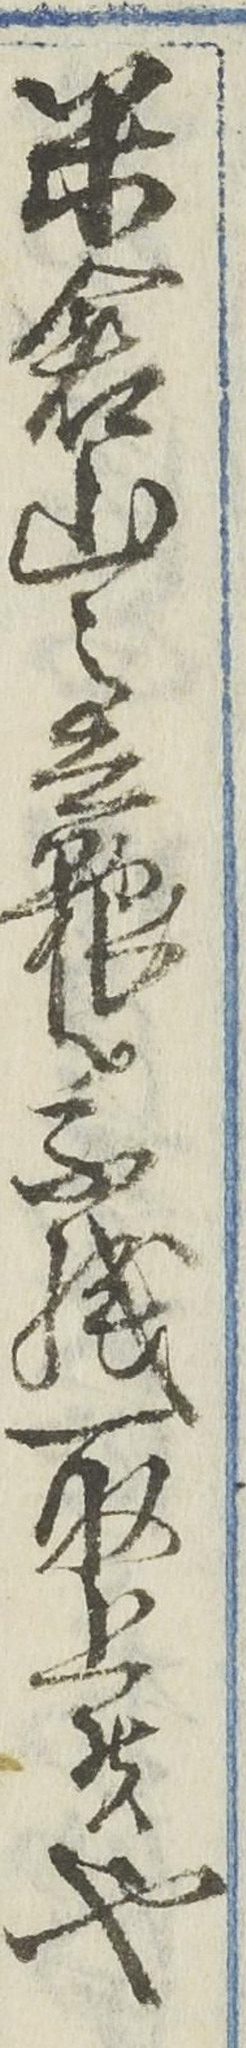米倉山之兵粮ヲ不残取上候也
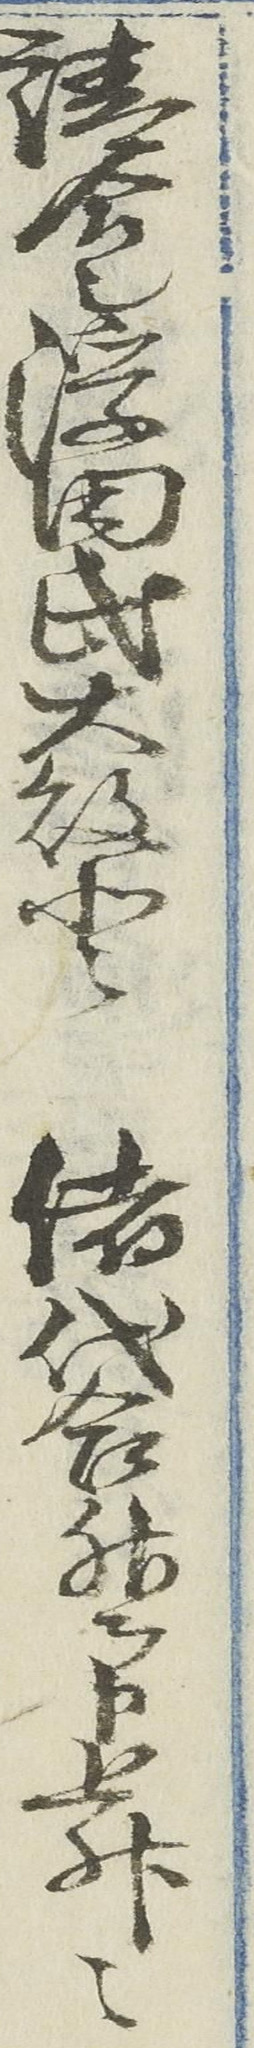請合シ浮田氏大役と偖代合升テ申上升二
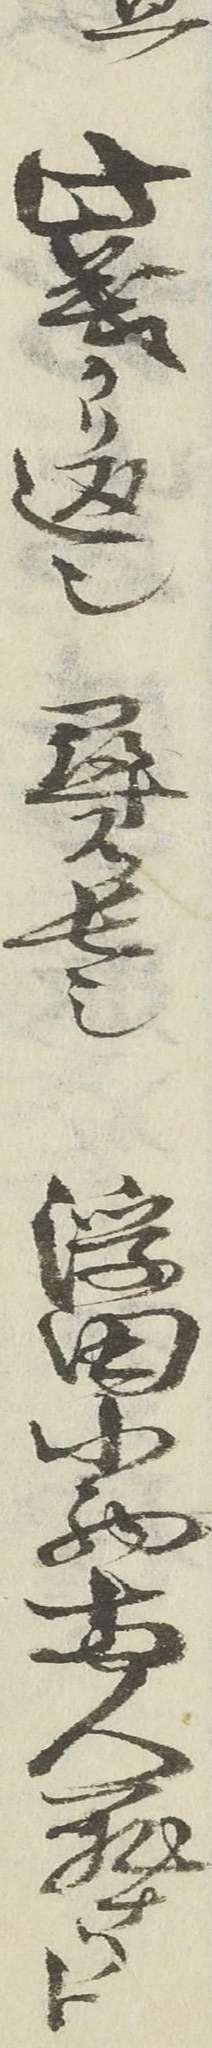且此義クリ返シ尋ㇽ長シ浮田小西両人罪ナリト
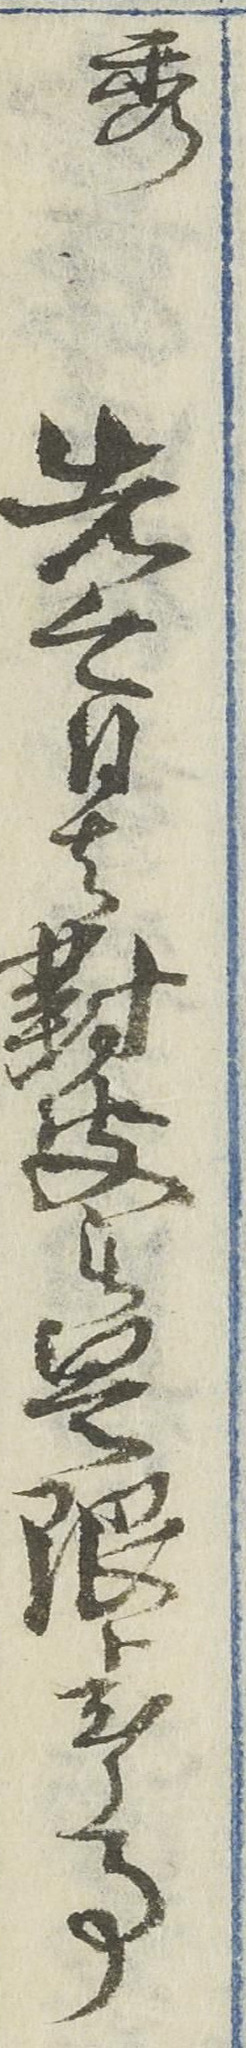秀先今日は対決も是限ト云う事
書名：伏水大地震
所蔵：東京大学地震研究所図書室 Earthquake Research Institute Library, The University of Tokyo, JAPAN
